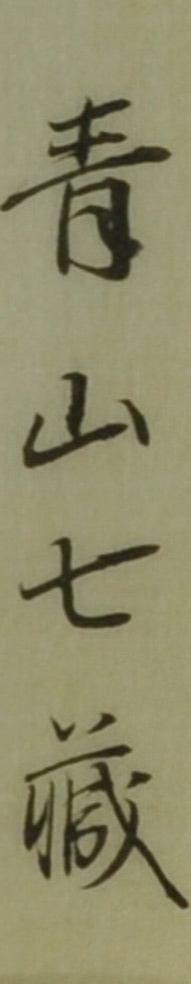青山七蔵
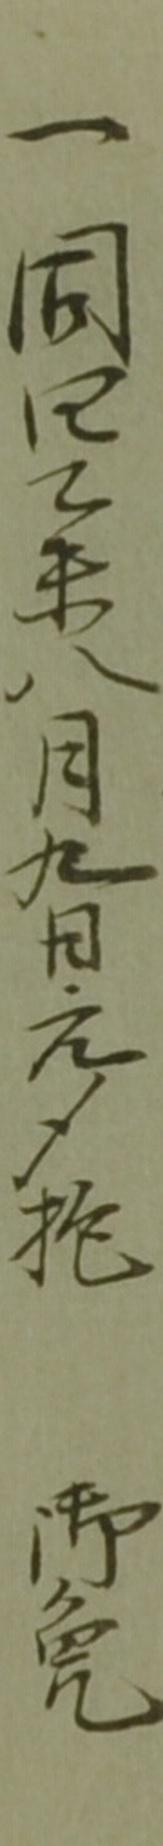一同四乙未八月九日元〆抱御免
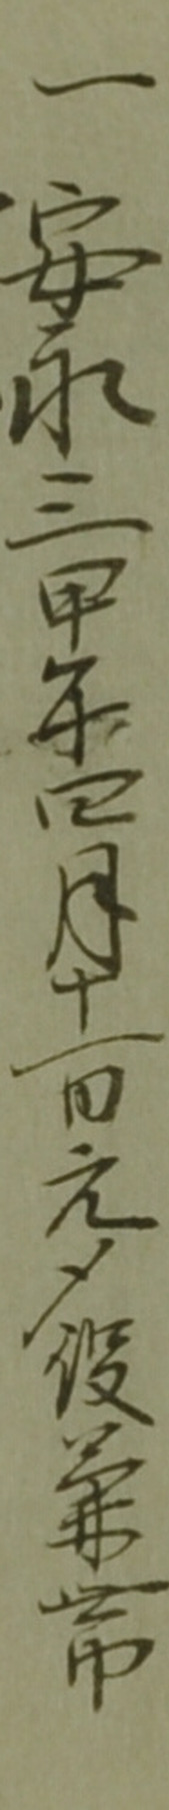一安永三甲午四月十一日元〆役兼帯
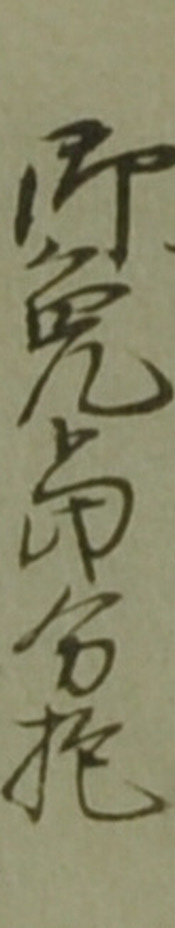御免当分抱
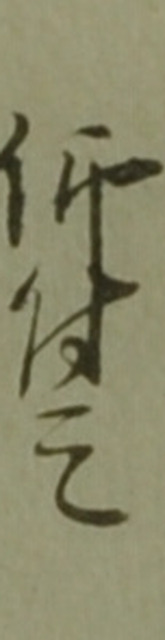仰付之
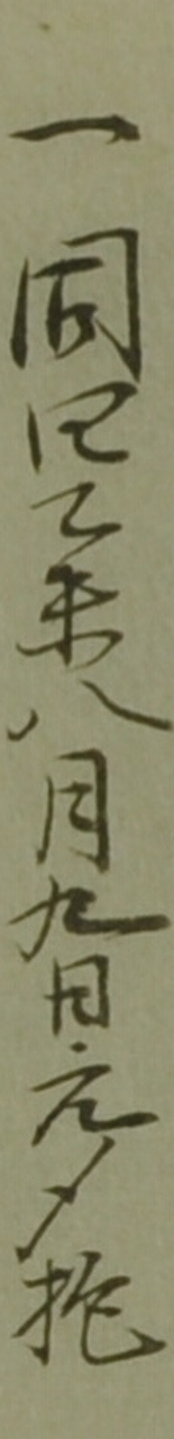一同四乙未八月九日元〆抱御免
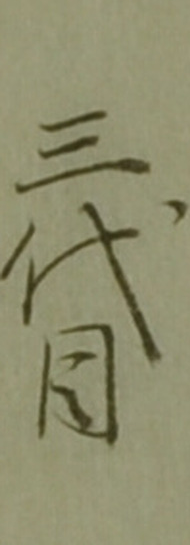三代目
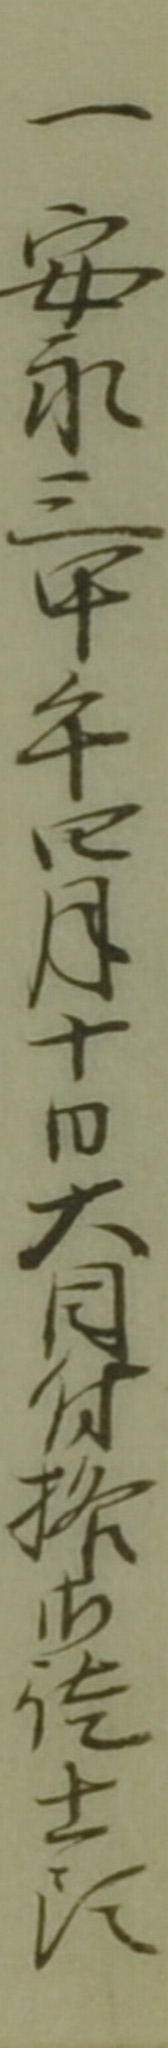一安永三甲午四月十日御目付格御徒士頭
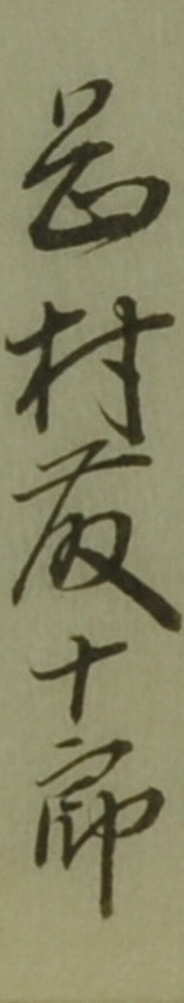岡村藤十郎
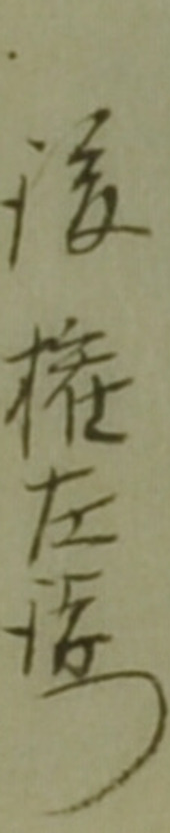後権左衛門
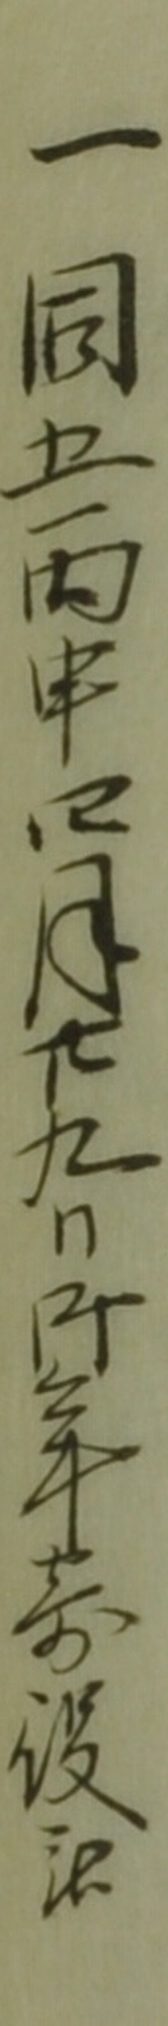一同五丙申四月廿九日御年寄役被
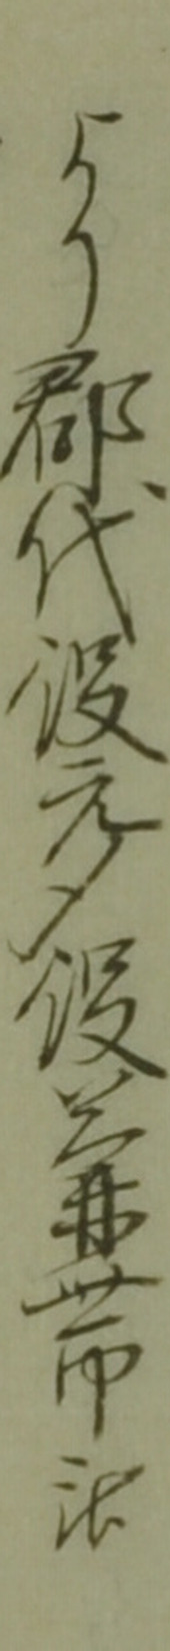より郡代役元〆役兼帯被
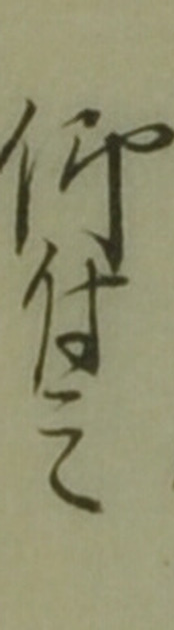仰付之
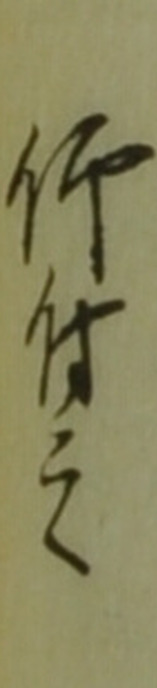仰付之
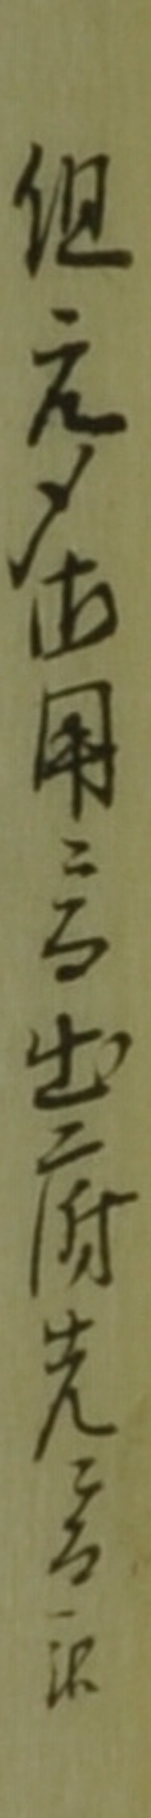但元〆御用ニ而出府先ニ而被
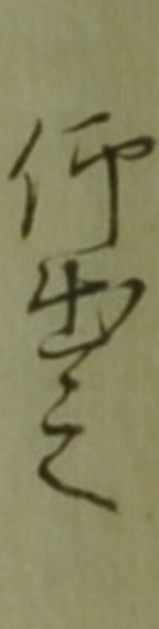仰出之
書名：諸御役代々録（七）
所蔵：伊那市立高遠町図書館・合同会社AMANE
